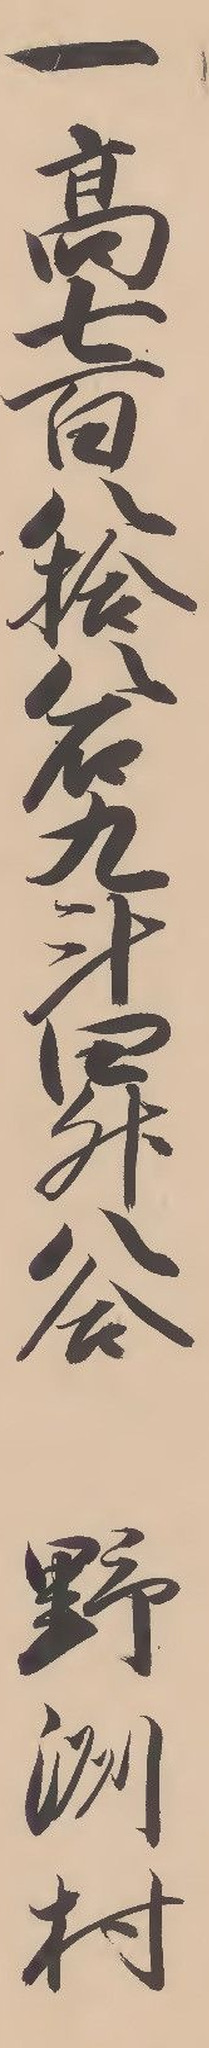一高七百八拾八石九斗四升八合野洲村

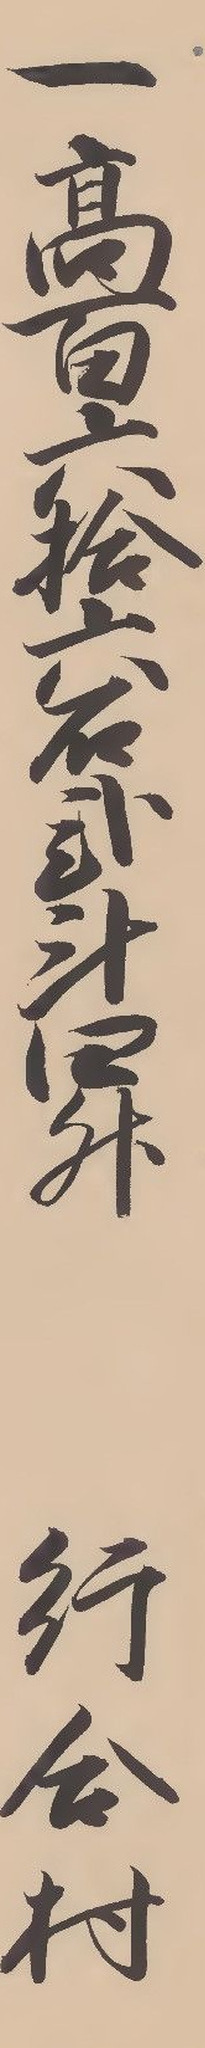一高百六拾六石弐斗四升行合村
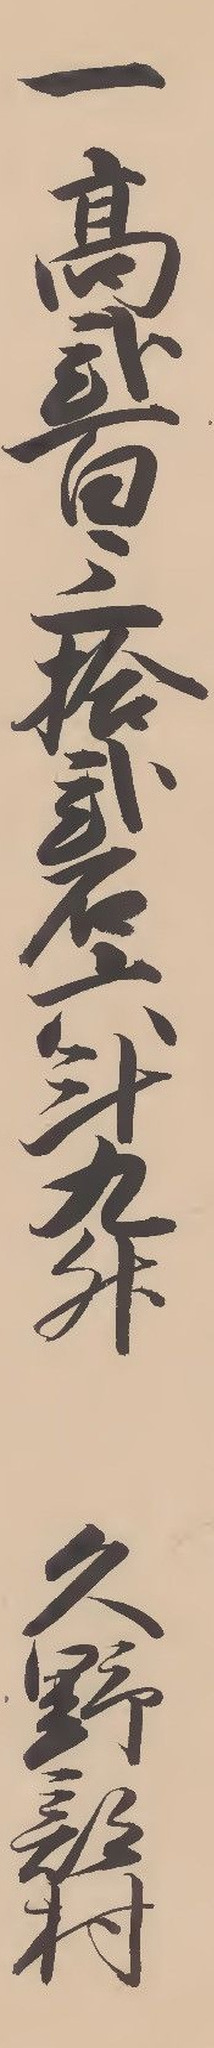一高弐百三拾弐石六斗九升久野部村
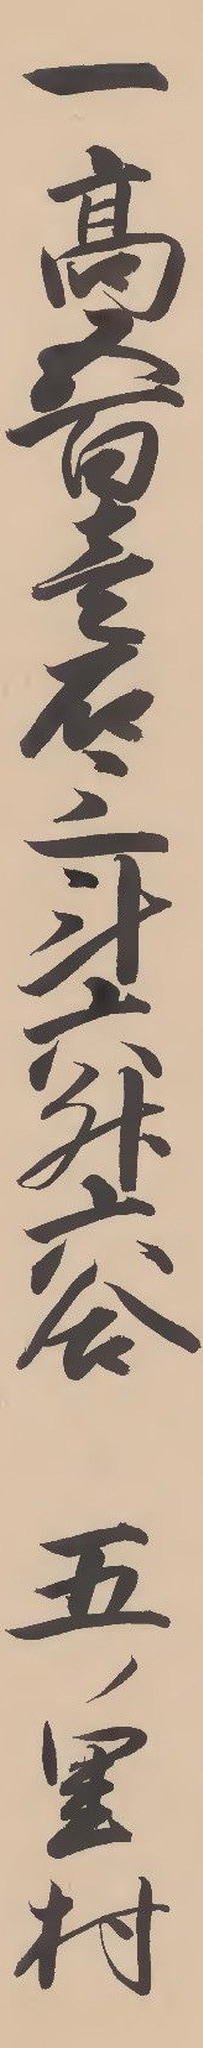一高五百壱石三斗六升六合五ノ里村
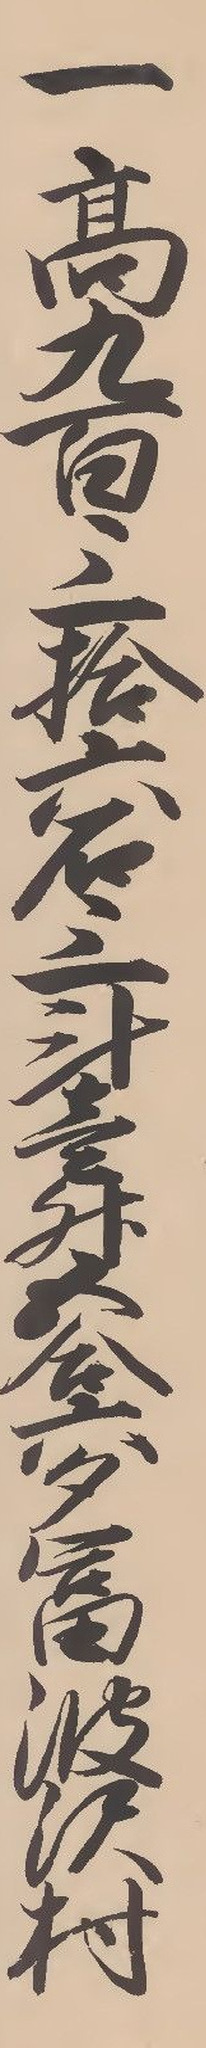一高九百三拾六石三斗壱升五合六勺富波沢村
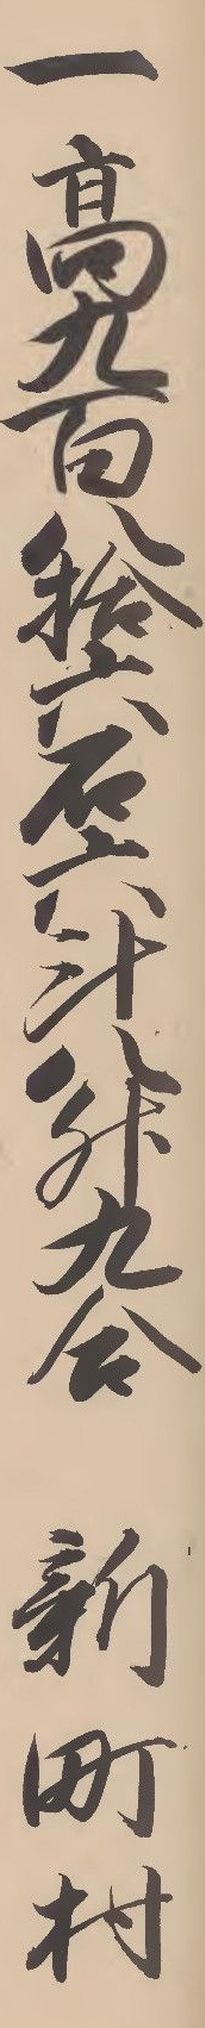一高九百八拾六石六斗八升九合新町村
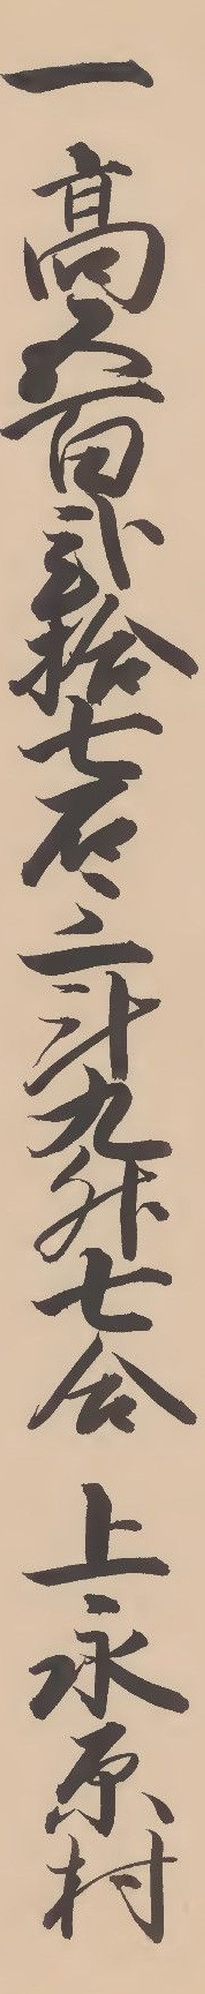一高五百弐拾七石三斗九升七合上永原村
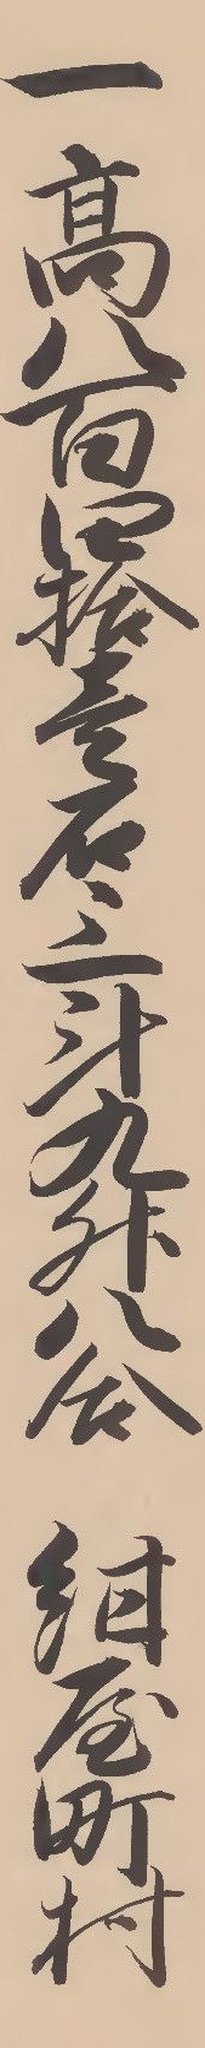一高八百四拾壱石三斗九升八合紺屋町村
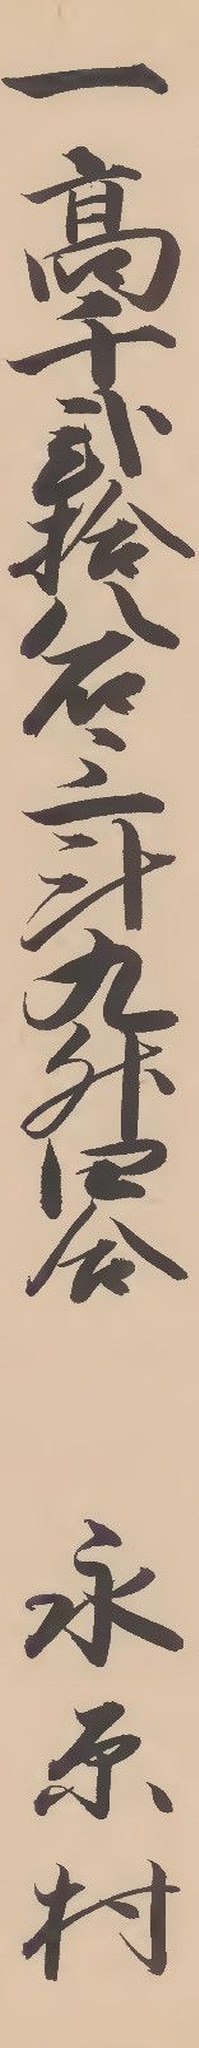一高千弐拾八石三斗九升四合永原村

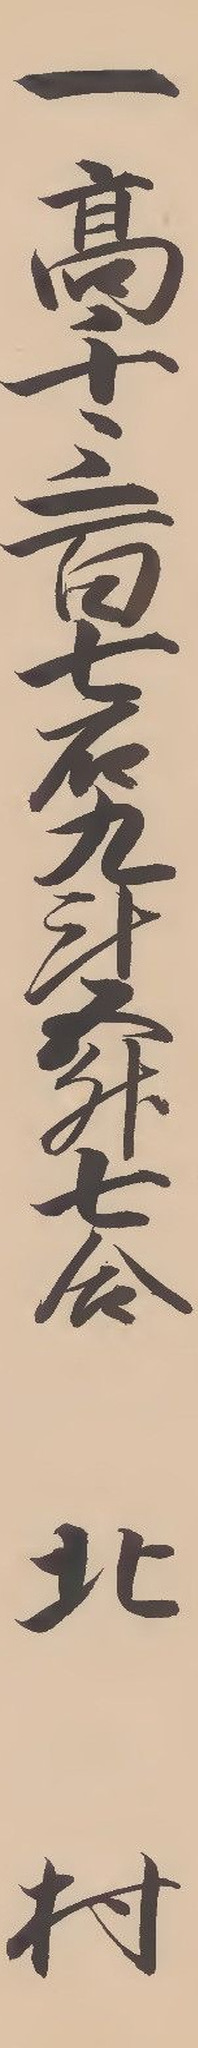一高千三百七石九斗五升七合北村
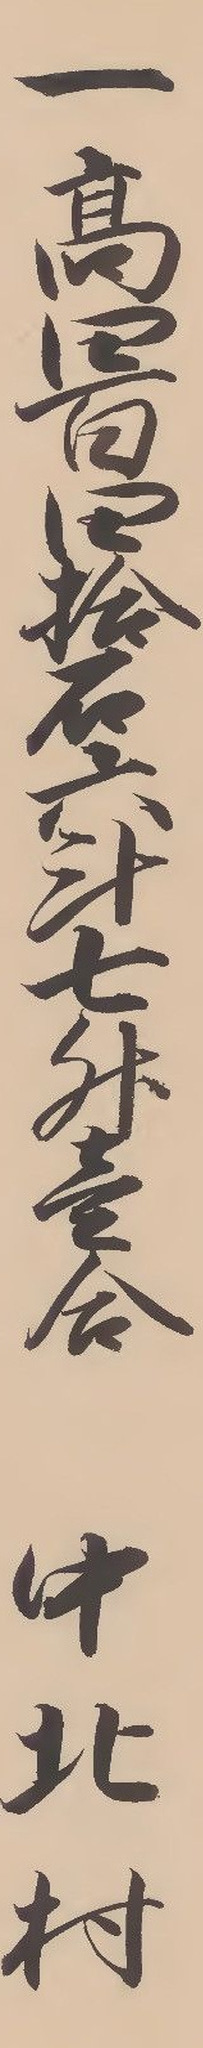一高四百四拾石六斗七升壱合中北村
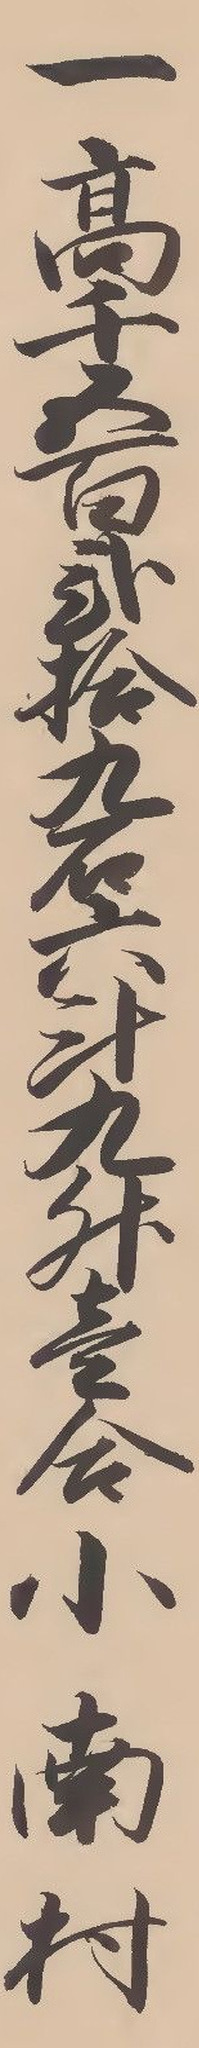一高千五百弐拾九石六斗九升壱合小南村
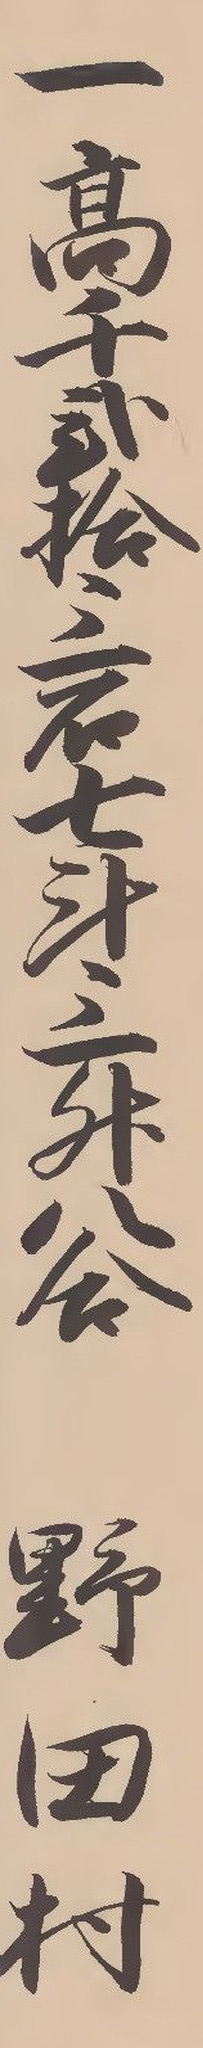一高千弐拾三石七斗三升八合野田村
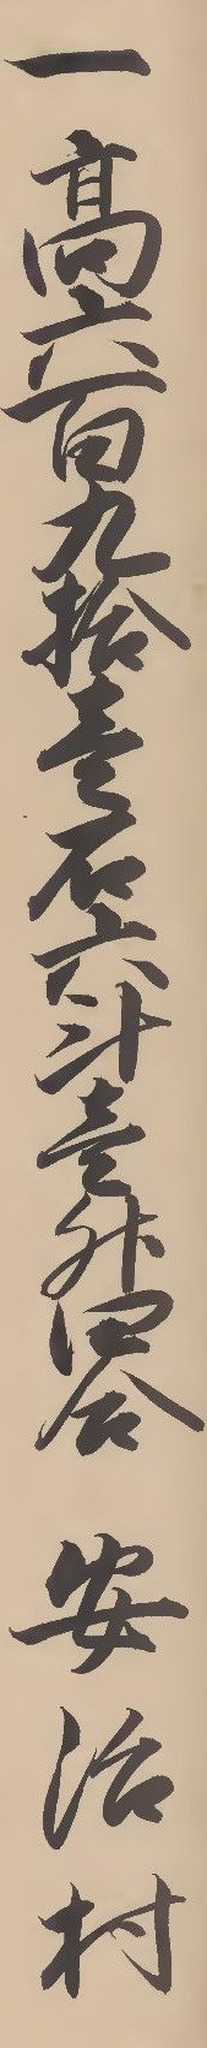一高六百九拾壱石六斗壱升四合安治村
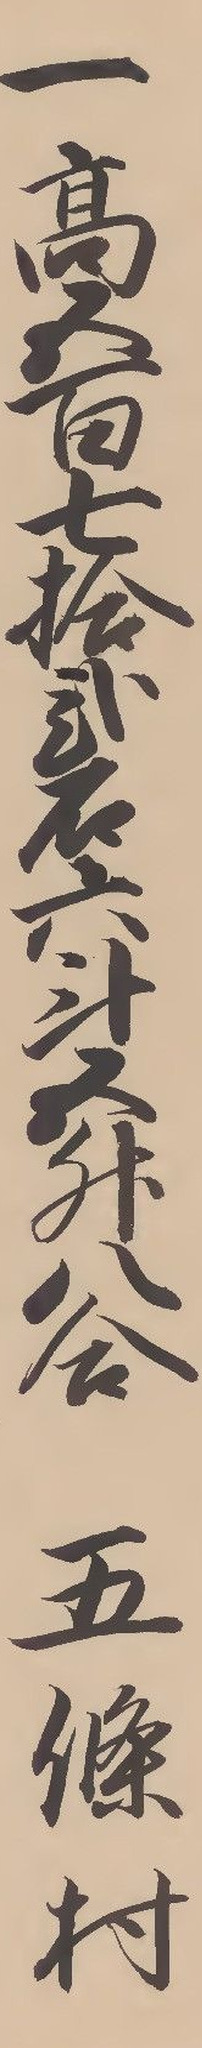一高五百七拾弐石六斗五升八合五条村
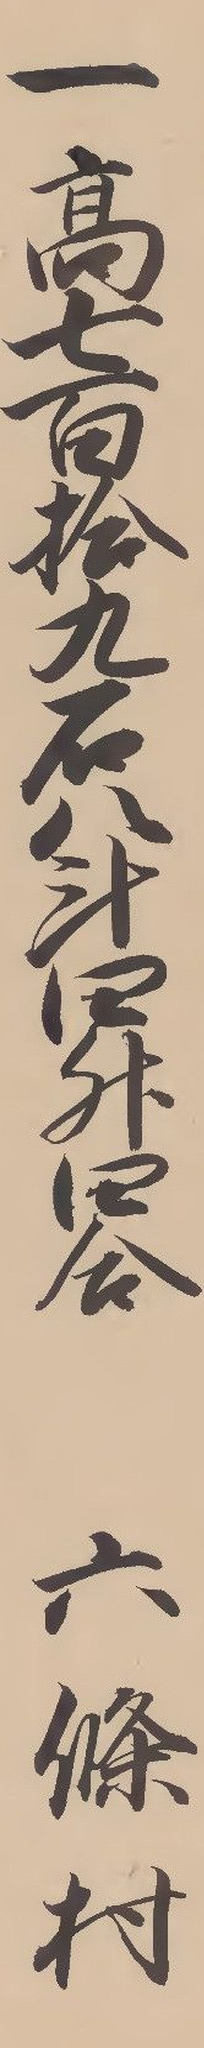一高七百拾九石八斗四升四合六条村
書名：近江国郷帳
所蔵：国立公文書館 National Archives of Japan
